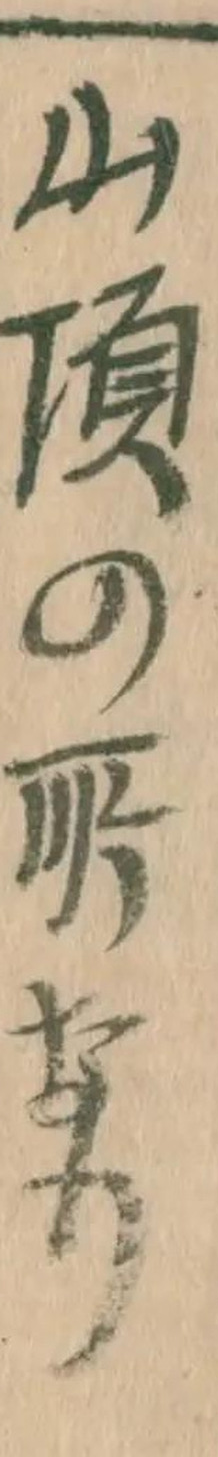山頂の所なり
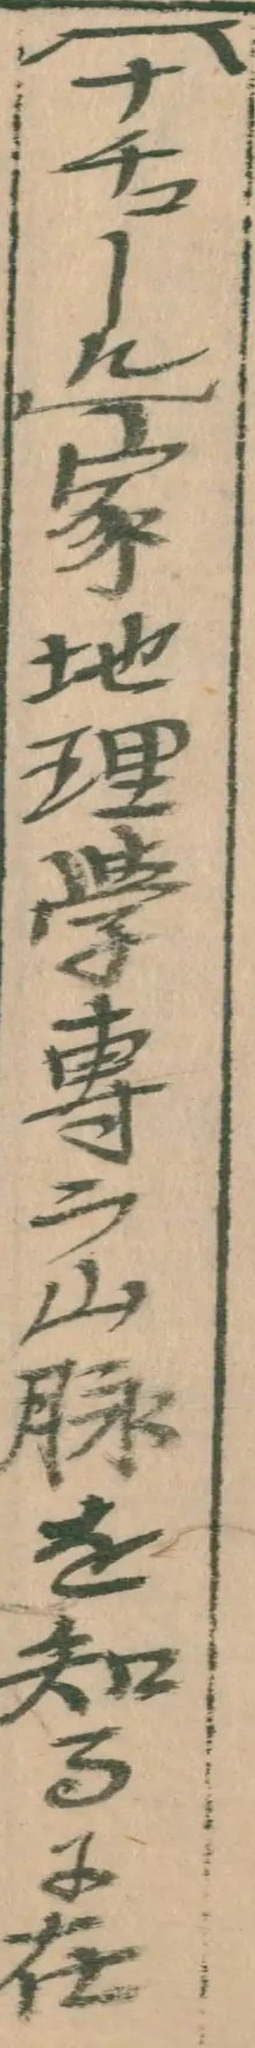(ナチュール)家地理学専ら山脈を知るに在
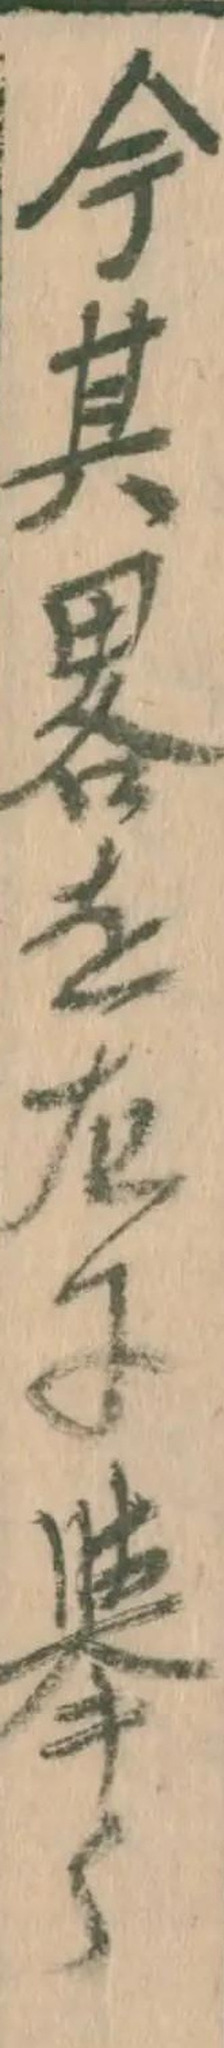今其略を左に挙く
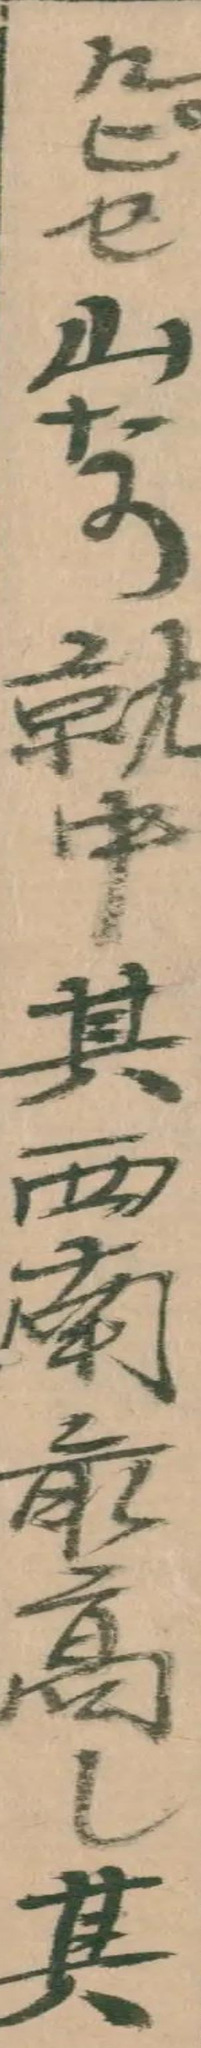ルピセ山なり就中其西南最高し其
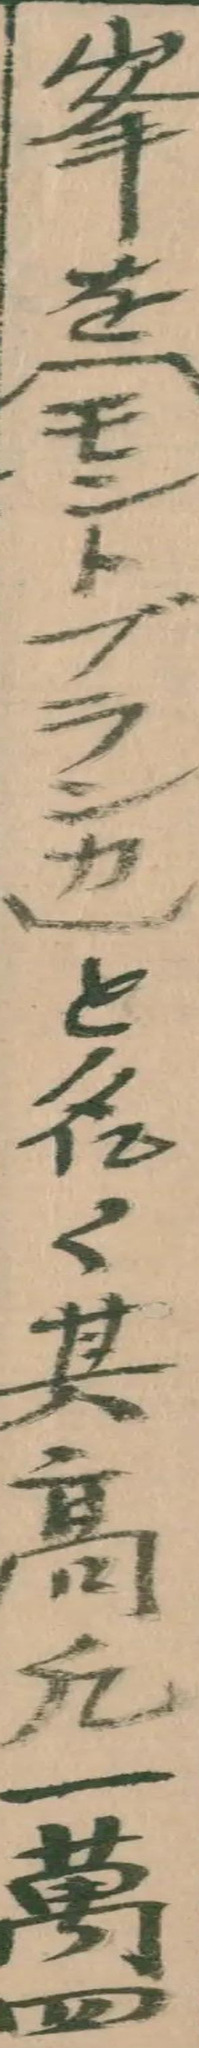峰を(モントブランカ)と名く其高凡一万四
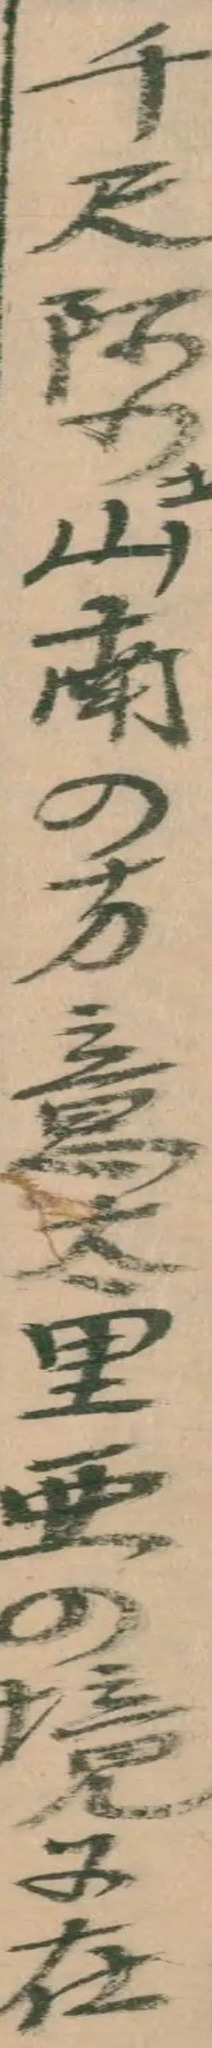千尺あり此山南の方意太里亜の境に在
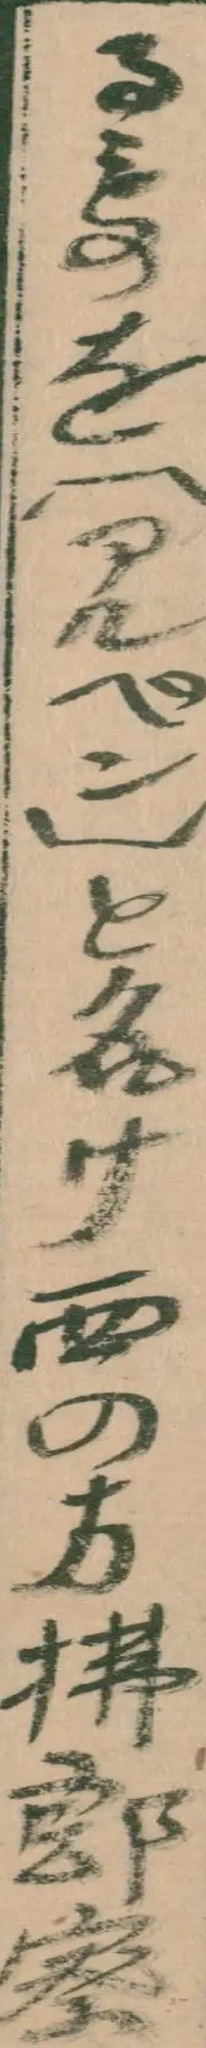るものを(アルペン)と名け西の方払郎察
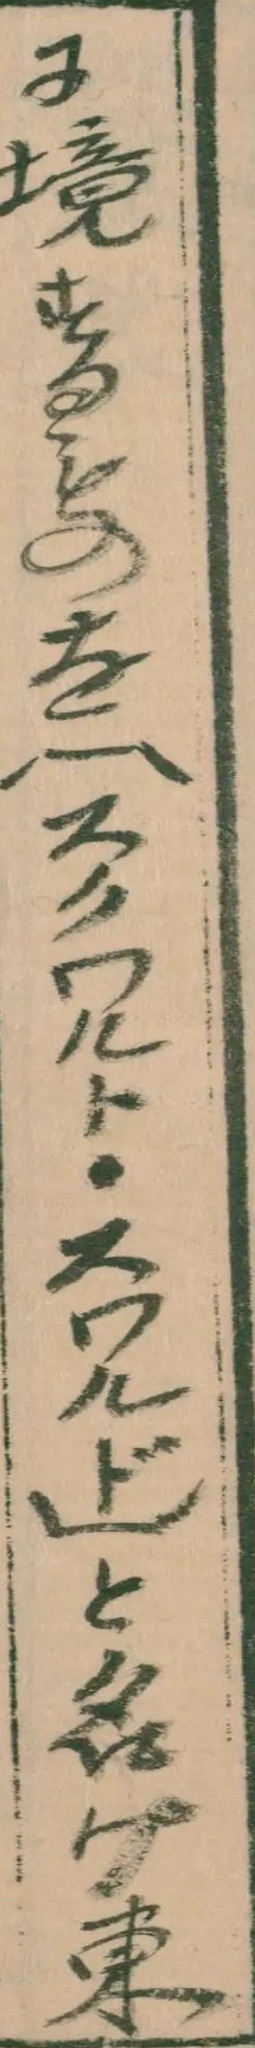に境するものを(スクワルト・スワルド)と名け東
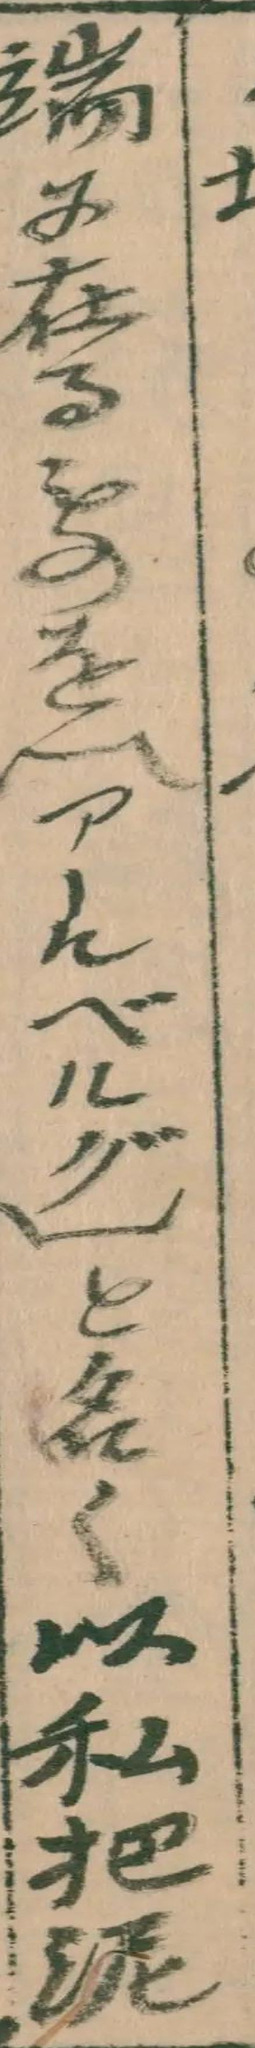端に在るものを(アールベルグ)と名く以私把泥
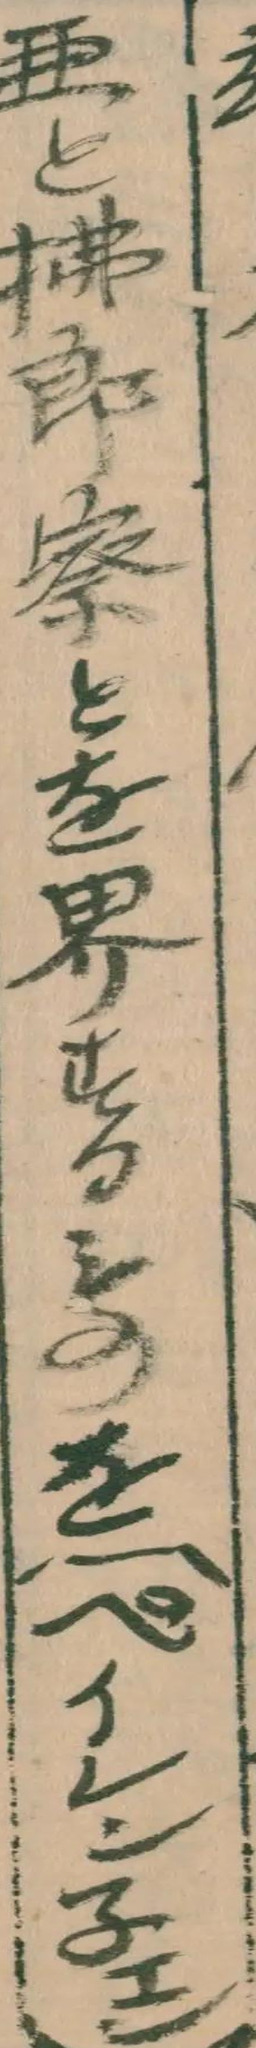亜と払郎察とを界するものを(ペイレンネエン)
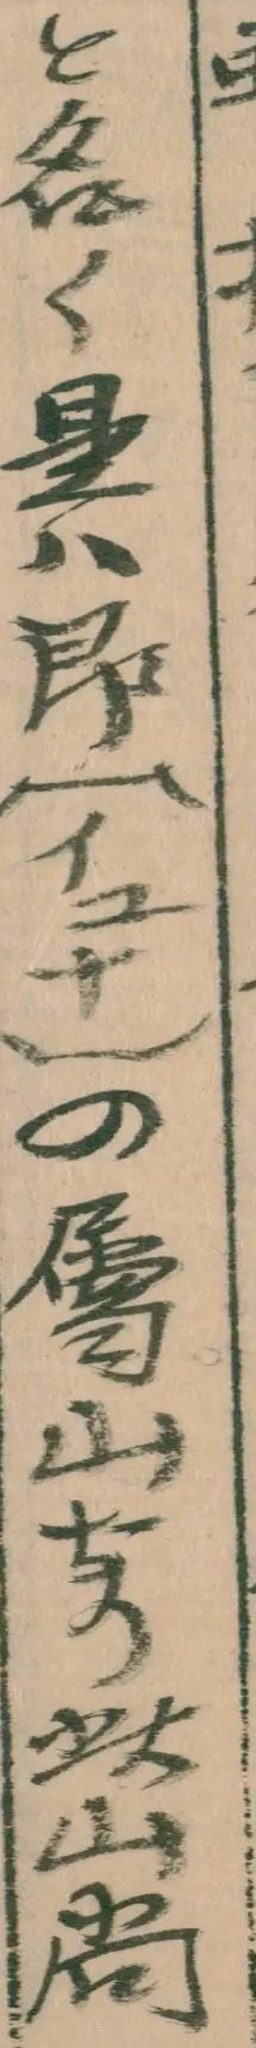と名く是は即(イユナ)の属山なり此山尚
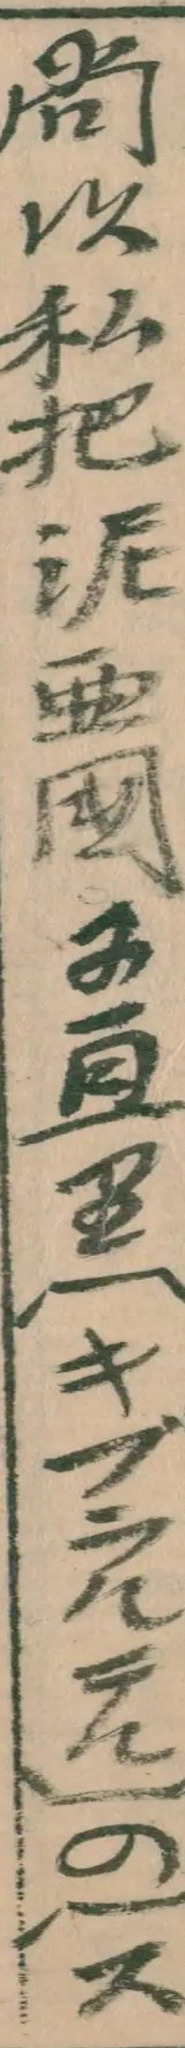尚以私把泥亜国に亘り(キブラルテル)の(ス
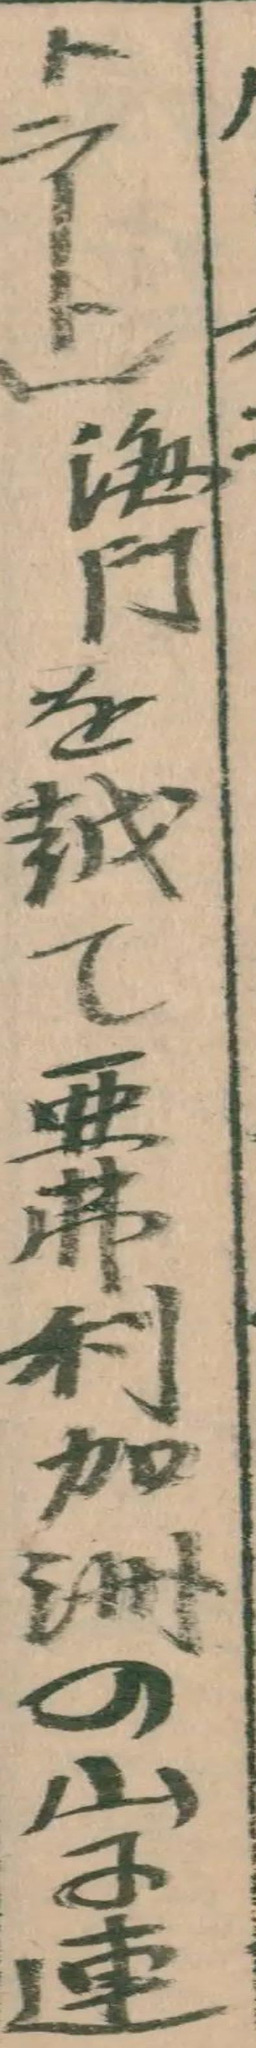トラート)海門を越て亜弗利加洲の山に連
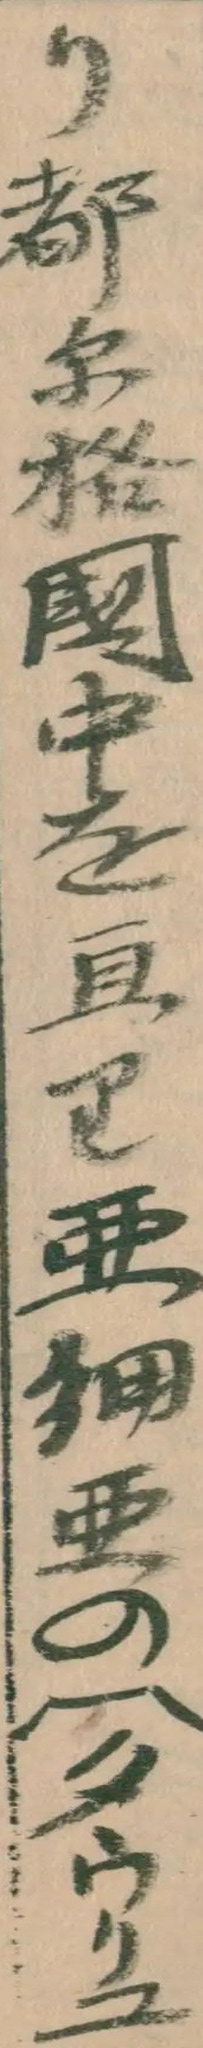り都尓格国中を亘り亜細亜の(タウリユ
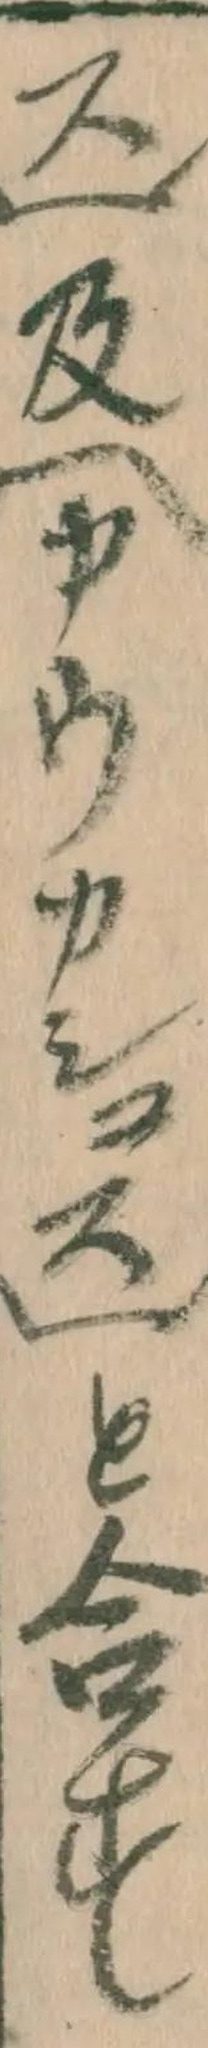ス)及(カウカシュス)と合す
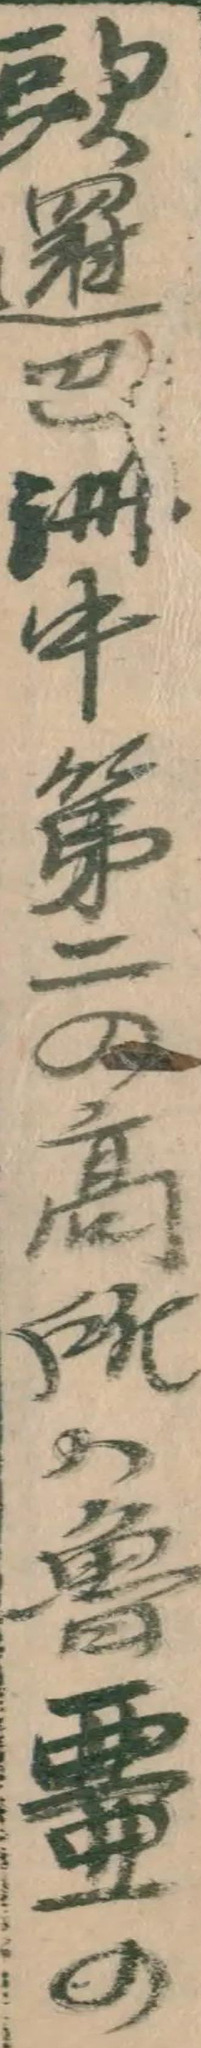欧邏巴洲中第二の高所の魯西亜の
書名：新釈輿地図説
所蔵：国立国会図書館 National Diet Library, JAPAN
